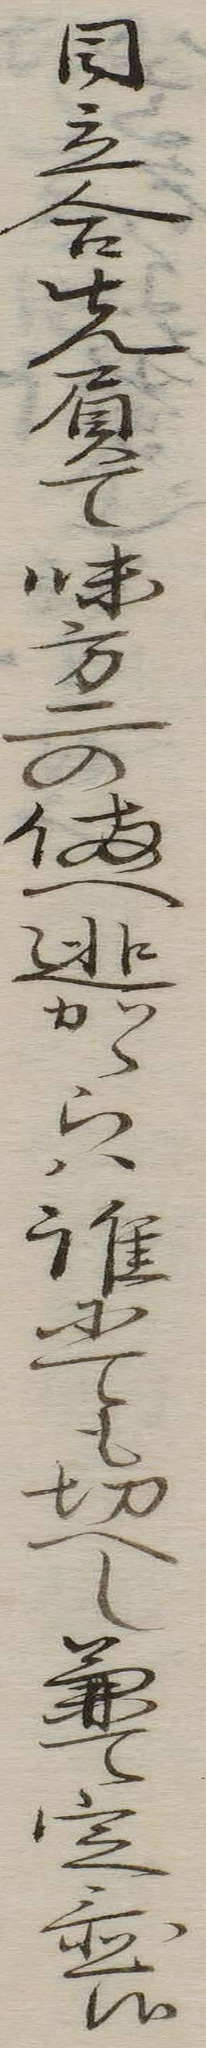目立合先負て味方ニの備へ逃かゝらは誰にても切へし兼て定置候
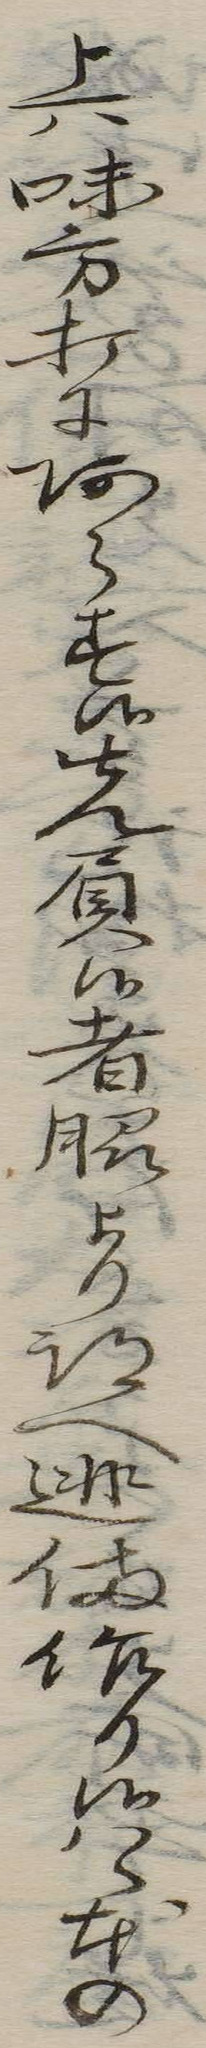上は味方打にあらす候先負候者脇より跡へ逃備作り候はゝ本の
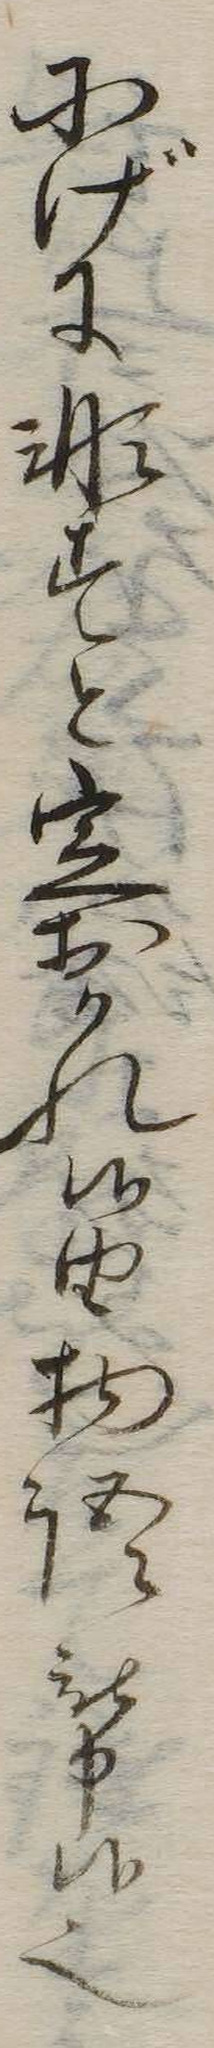にげに非すと定おかれ候由物語被申候也
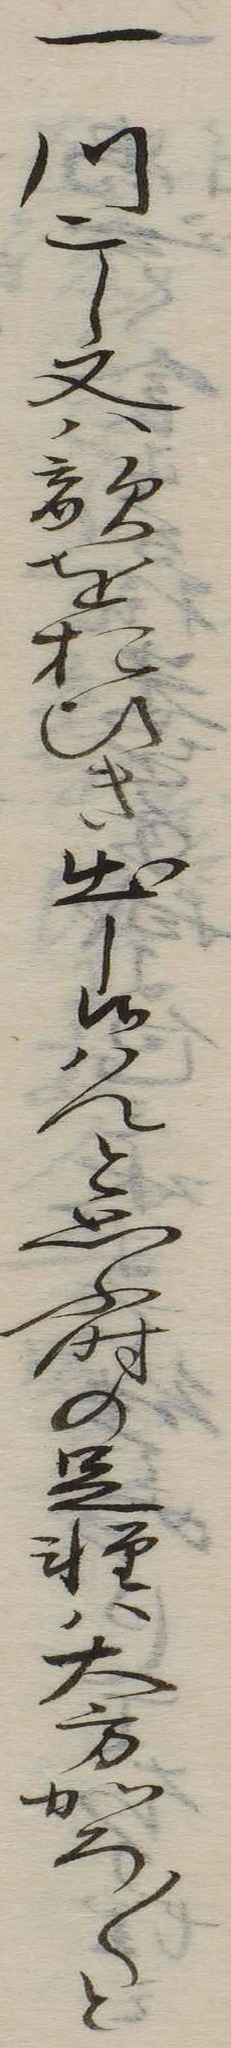一川こし又は敵をおひき出し候はんと思ふ時の足軽は大方かろ〳〵と
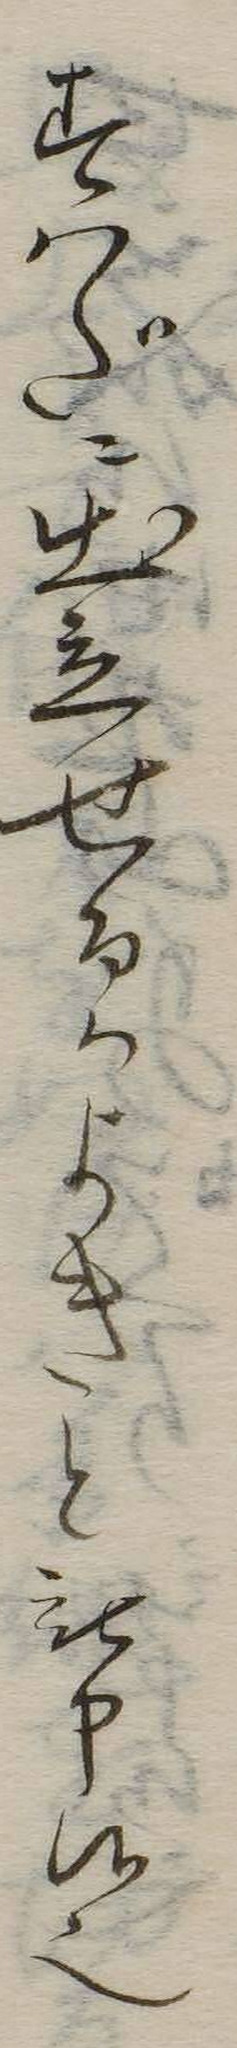すはだニ出立せるかよきと被申候也
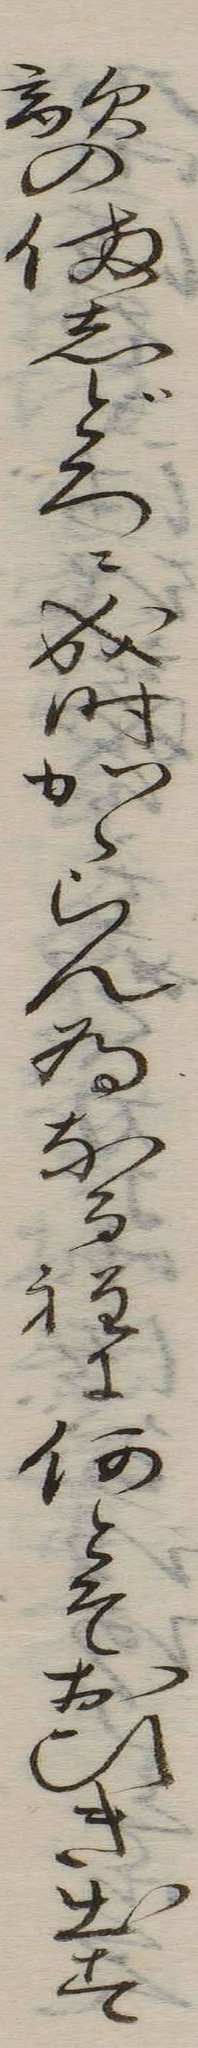一敵の備しどろニ成時かゝらん為なる程に何とそおひき出す
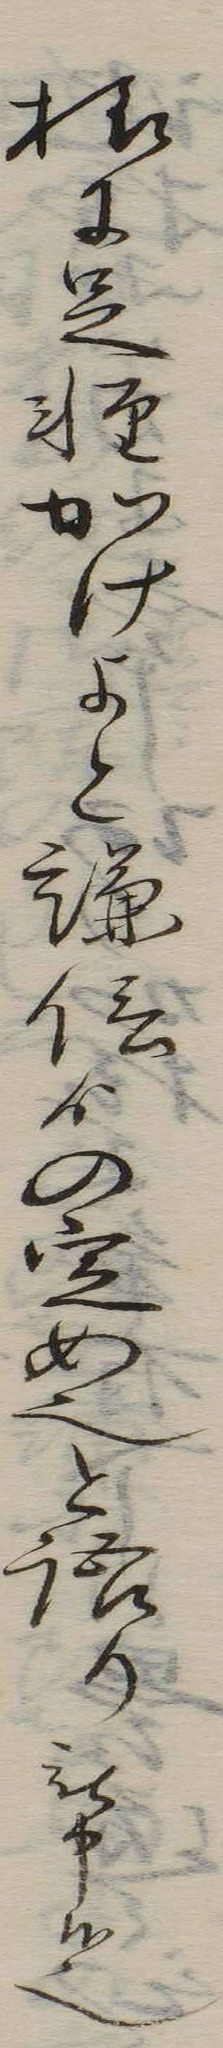様に足軽かけよと謙信ゟの定め也と語り被申候也
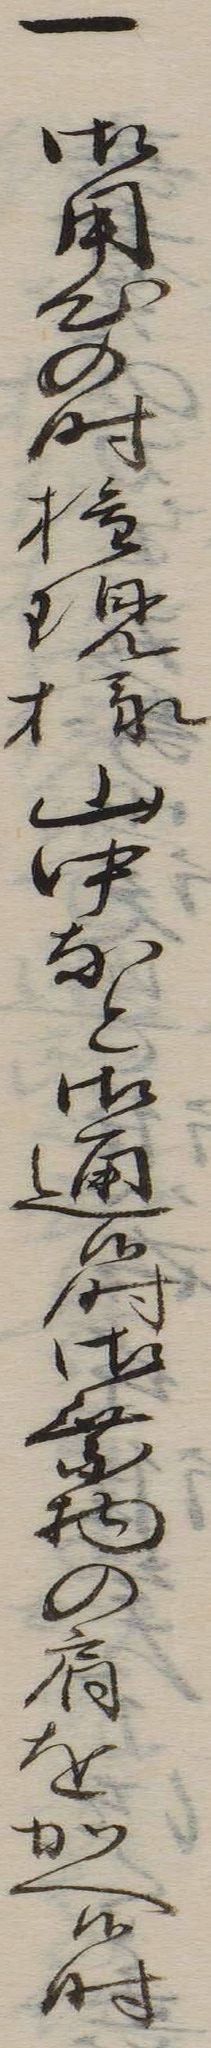一御用心の時権現様山中なと御通候時御乗物の肩をかへ候時
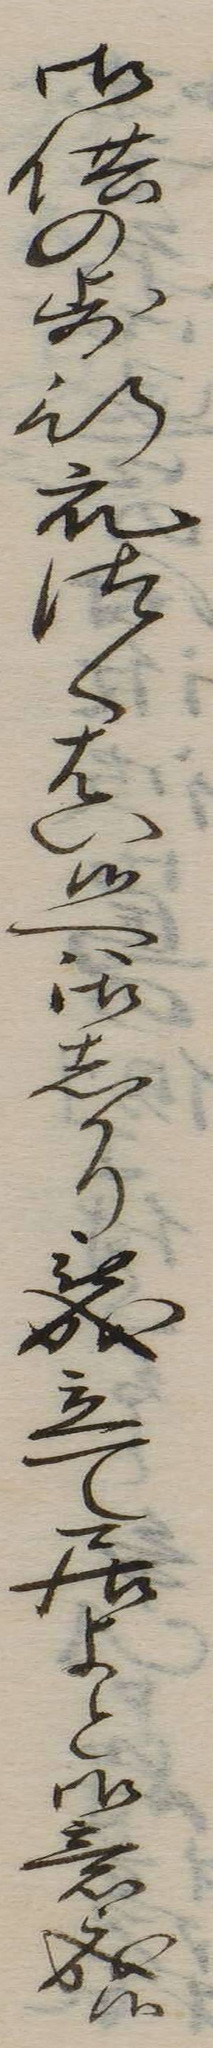御供の歩行衆つくはい候へは御しかり被成立て居よと御意被成候
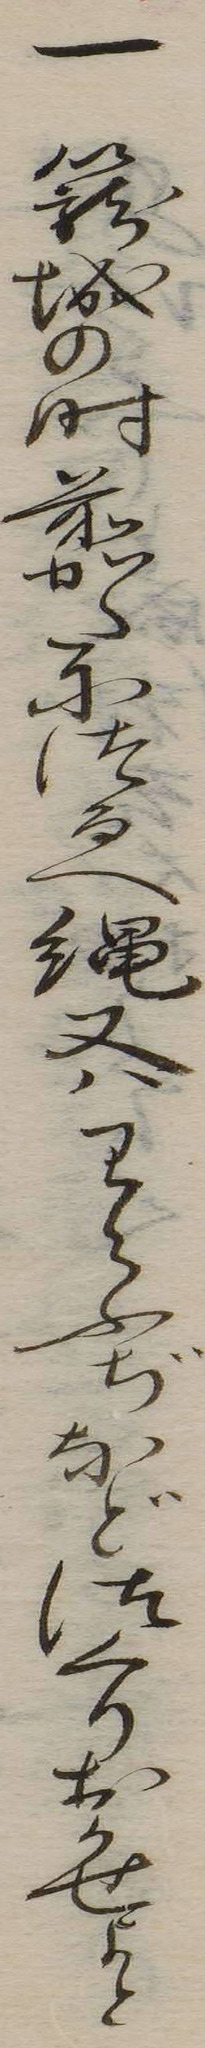一籠城の時前かたにつるへ縄又はわらふぢなどつくりおかせよと
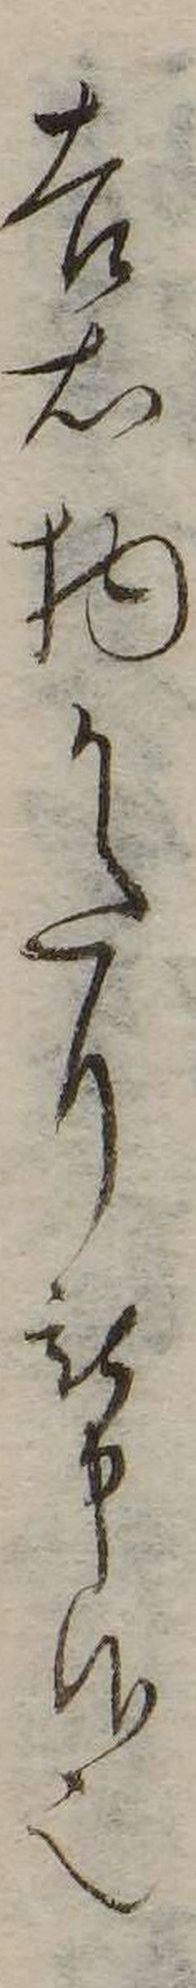吉右物かたり被申候也

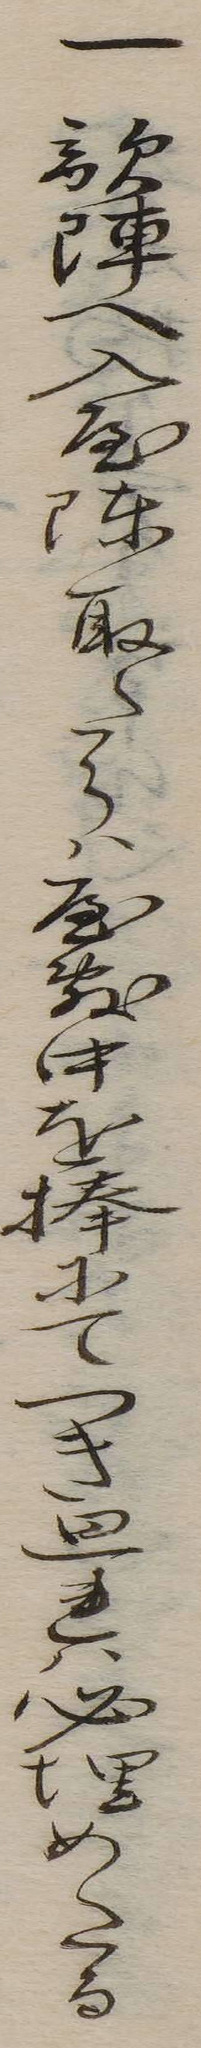一敵陣へ入屋陣取たらは屋敷中を棒にてつき廻れは必埋めたる
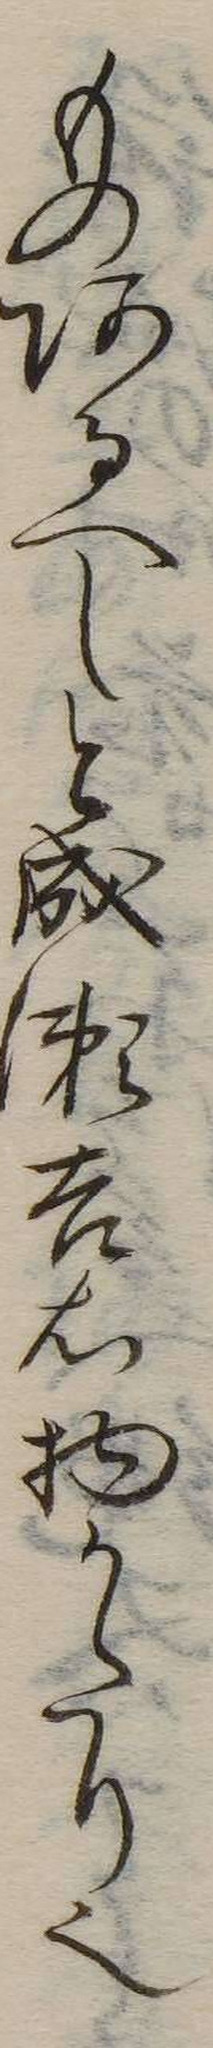ものあるへしと成瀬吉右物かたり也
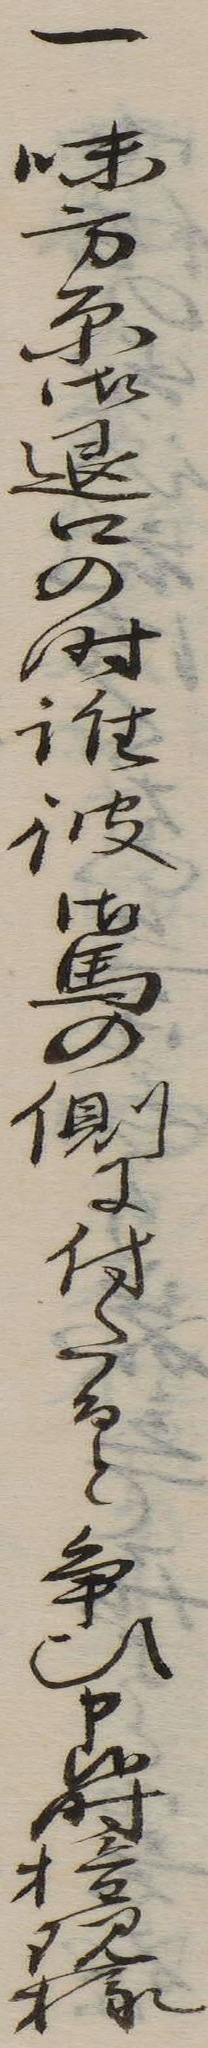一味方原御退口の時誰彼御馬の側に付たると争ひ申候字権現様
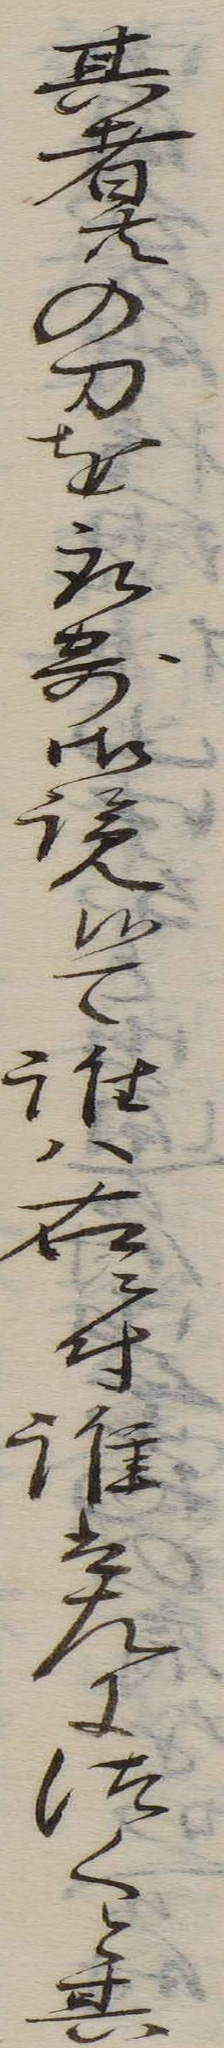其者共の刀を取寄御覧候て誰は右ニ付誰は左につくと其
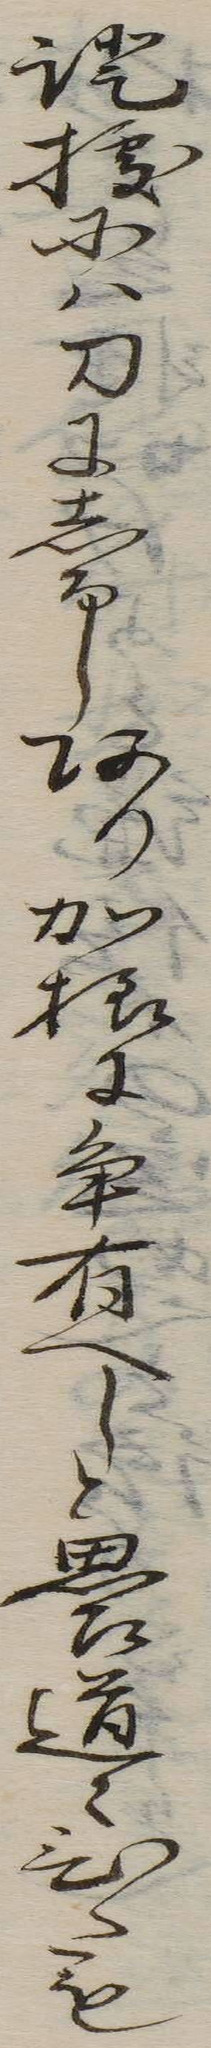証拠には刀にしるしありか様に争有へしと思召道々ひたも
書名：三河之物語
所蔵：国文学研究資料館
